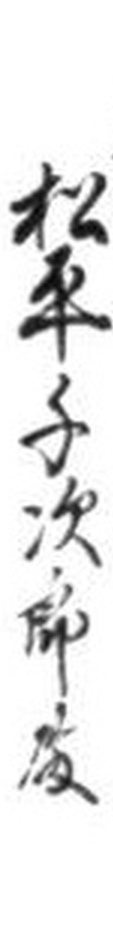松平千次郎殿忠之
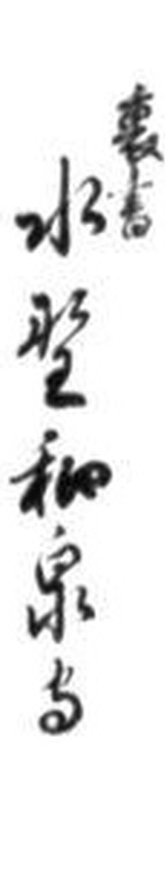水野和泉守
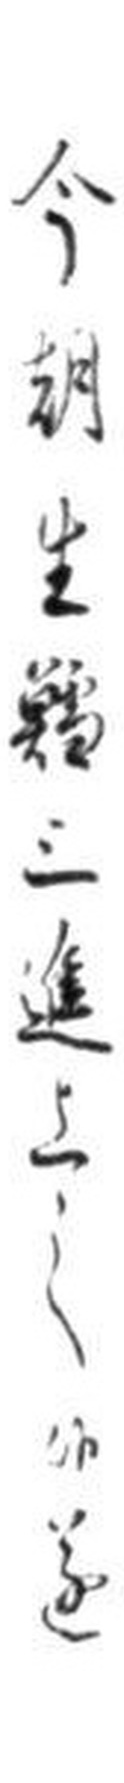今朝生鱈三進上之候遂
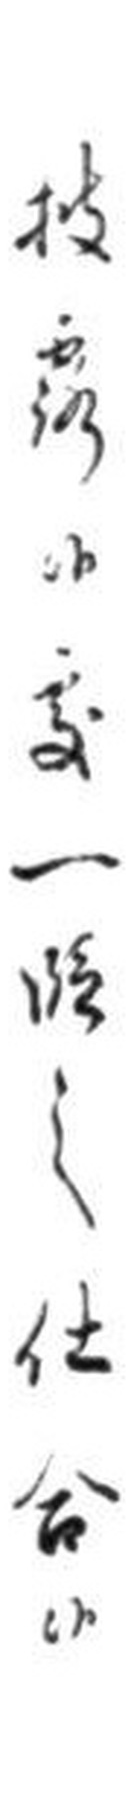披露候処一段之仕合候
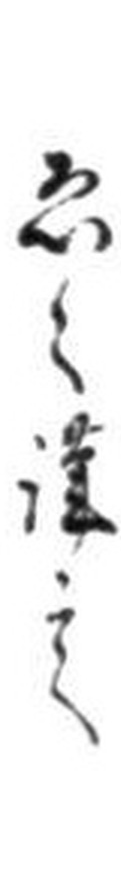恐々謹言
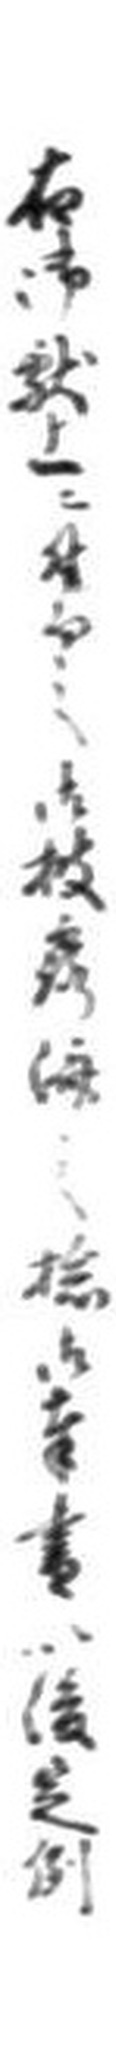右御献上ニ付而之御披露済之捻御奉書以後定例
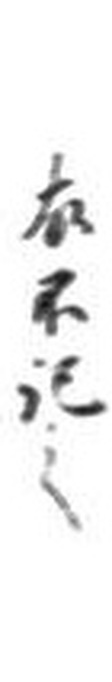故不記之
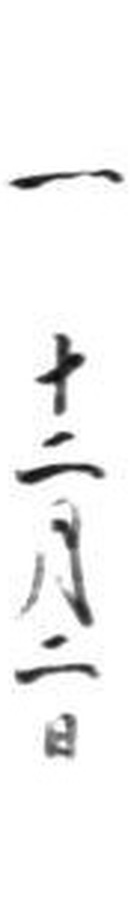一十二月二日
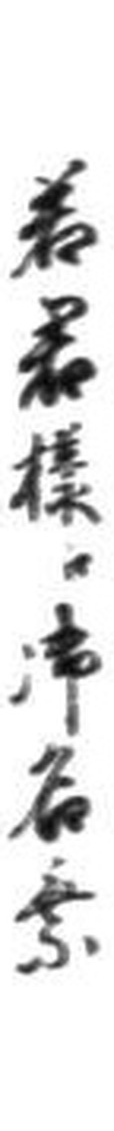若君様江御名乗
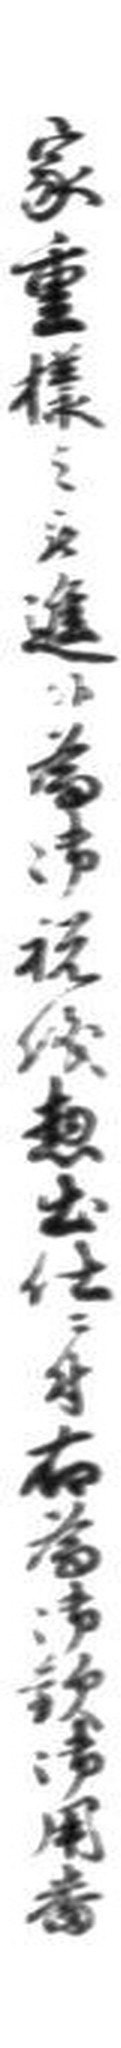家重様与被進候為御祝儀惣出仕ニ付右為御歓御用番

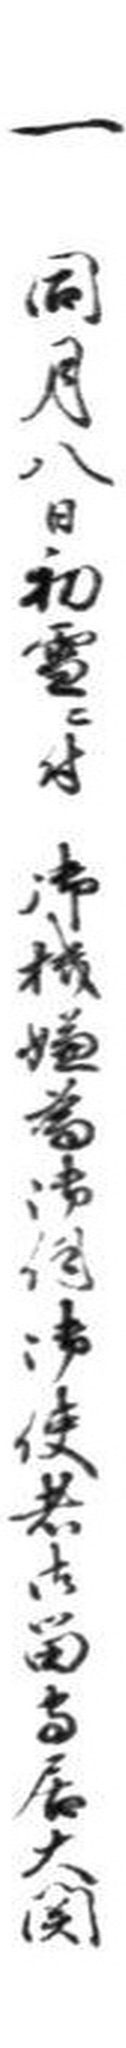一同月八日初雪ニ付御機嫌為御伺御使者御留守居大関
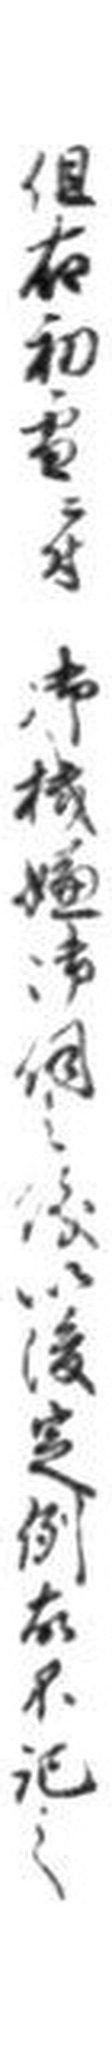但右初雪ニ付御機嫌御伺之儀以後定例故不記之
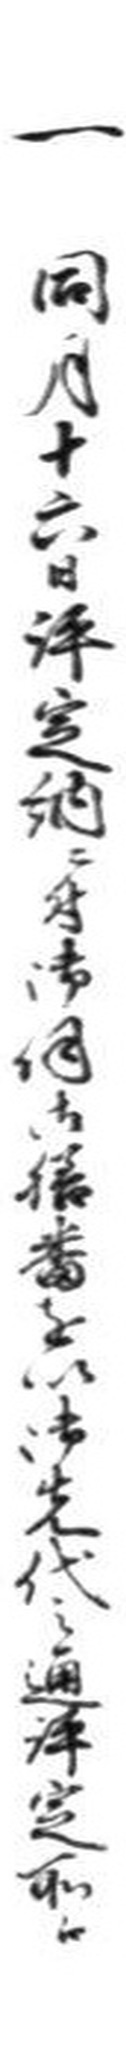一同月十六日評定納ニ付御伺御膳番を以御先代之通評定所江
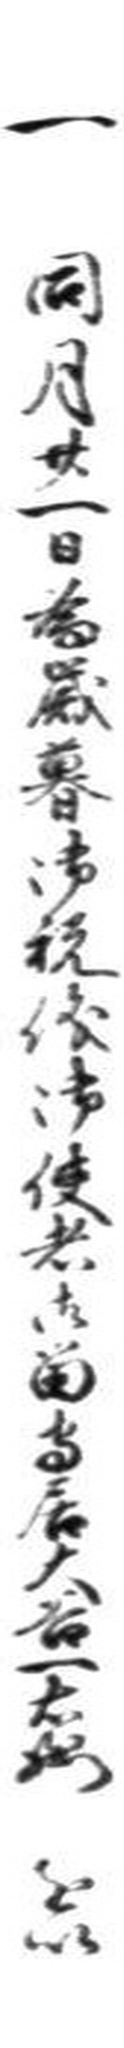一同月廿一日為歳暮御祝儀御使者御留守居大谷一右衛門を以
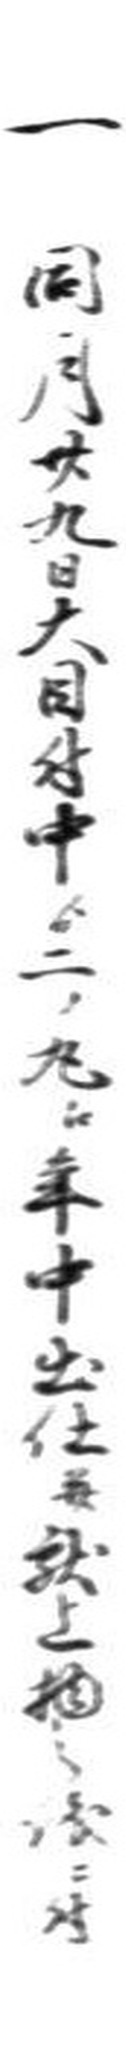一同月廿九日大目付中ゟ二ノ丸江年中出仕并献上物之儀ニ付
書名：家譜 三十八 宗矩公 従享保九年五月到享保九年十二月
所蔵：福井県文書館 Fukui Prefectural Archives
